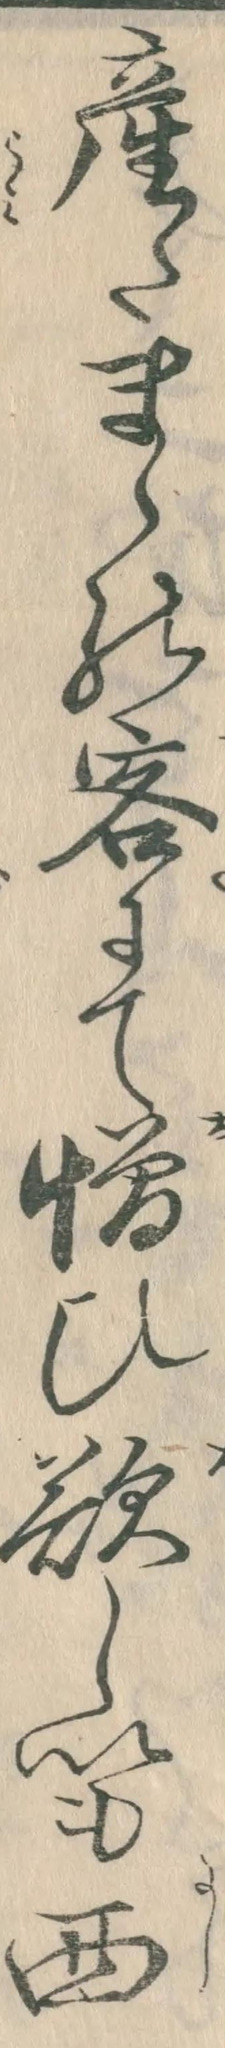産たまゝの客にて憎ひ欲しいも西
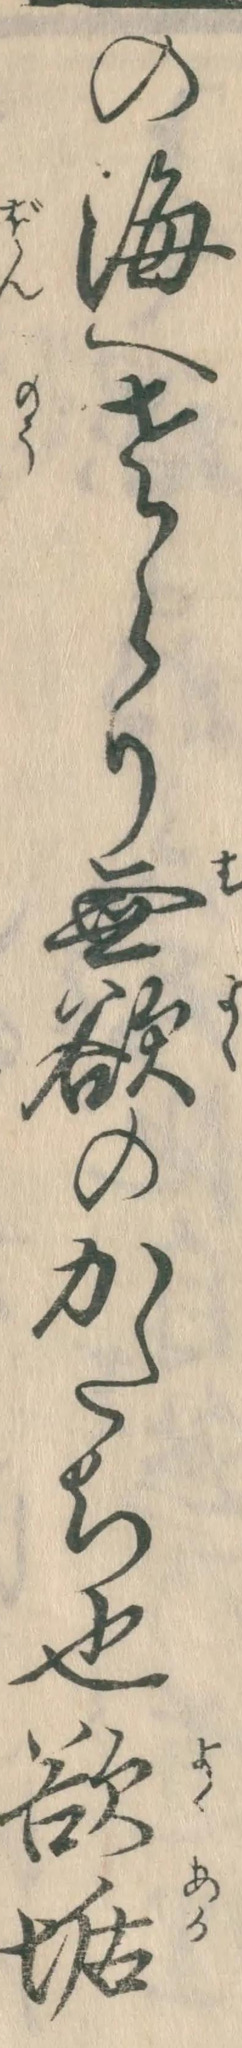の海へさらり無欲のかたち也欲垢
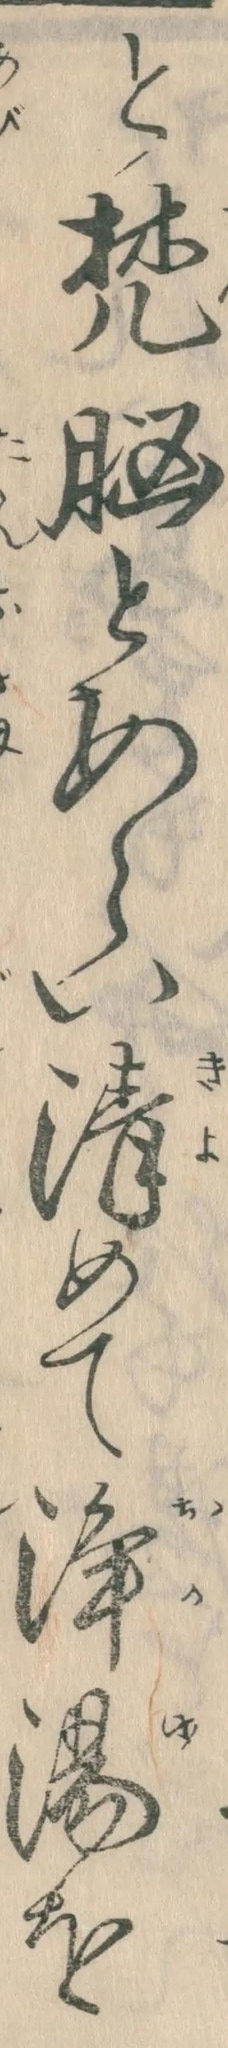と梵脳とあらい清めて浄湯を
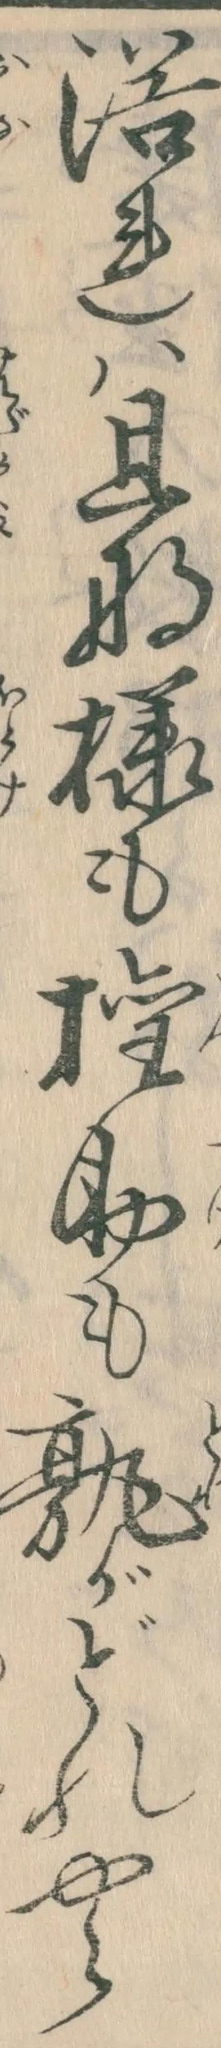浴れば旦那様も権助も孰がどれやら
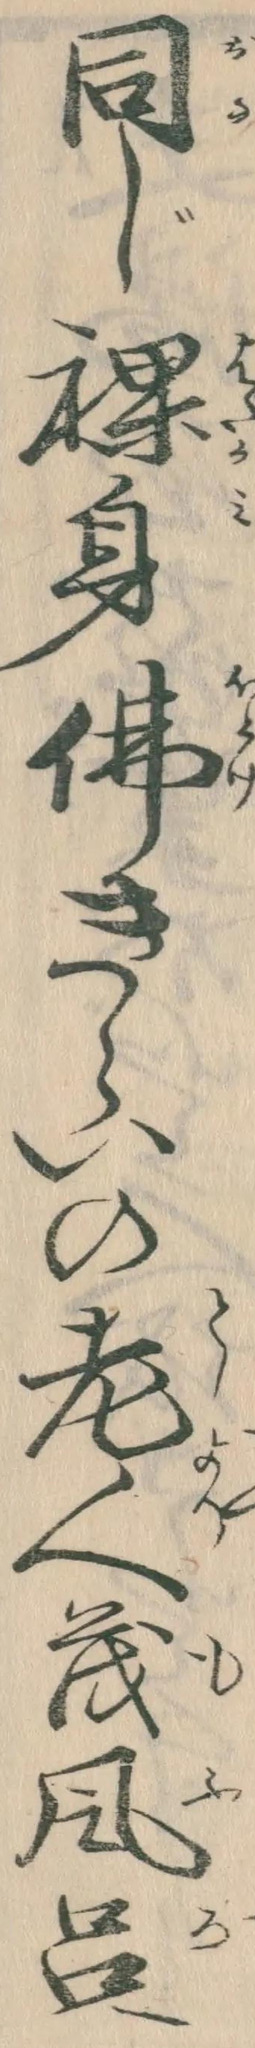同じ裸身仏きらいの老人茂風呂へ
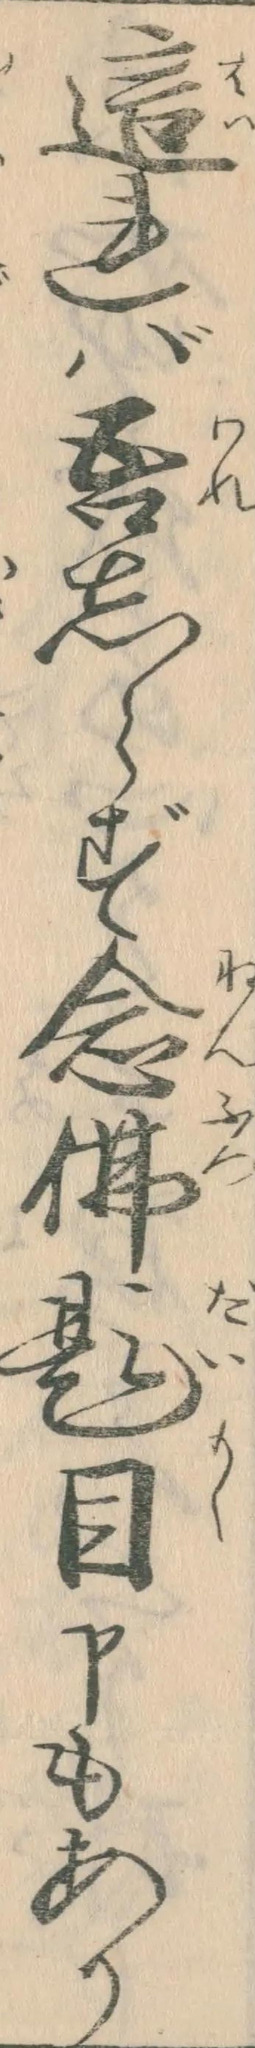這れば吾しらず念仏題目申もあり
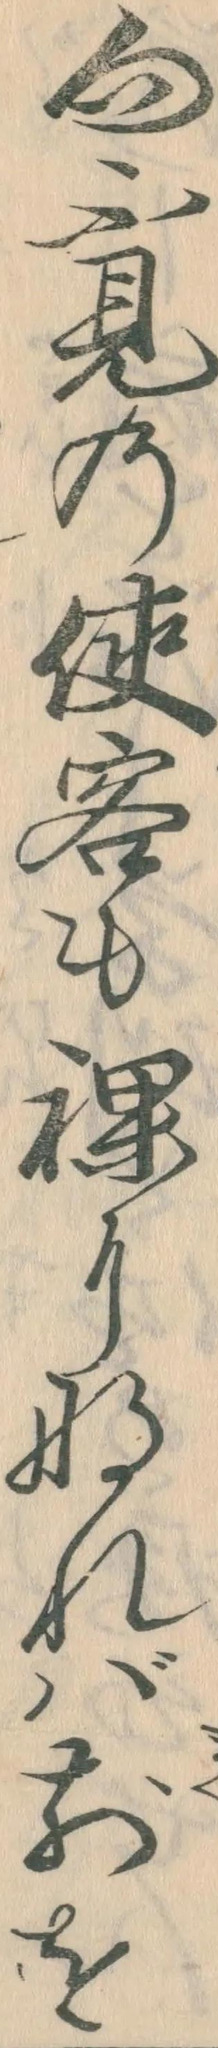向不見の侠客も裸になれば前を
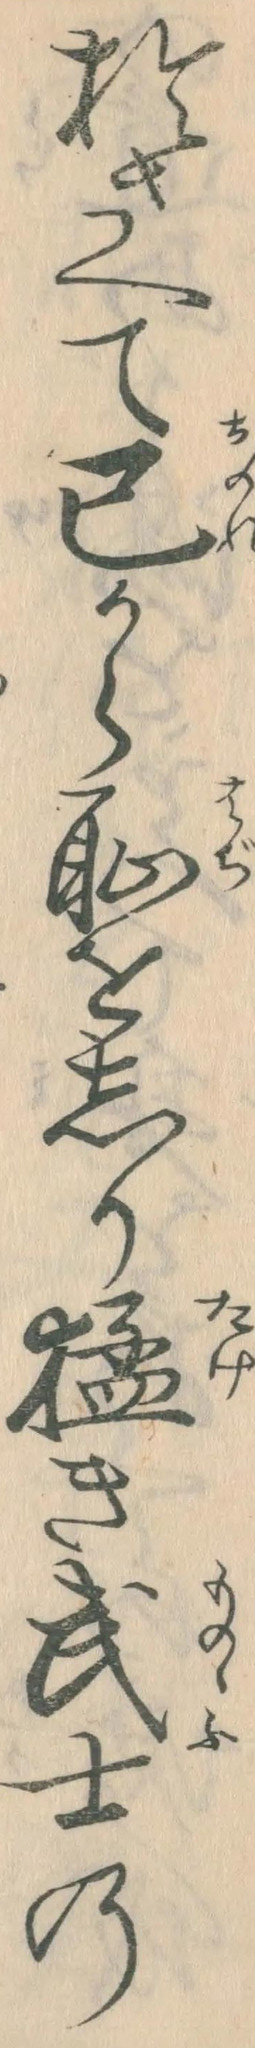おさへて己から恥をしり猛き武士の
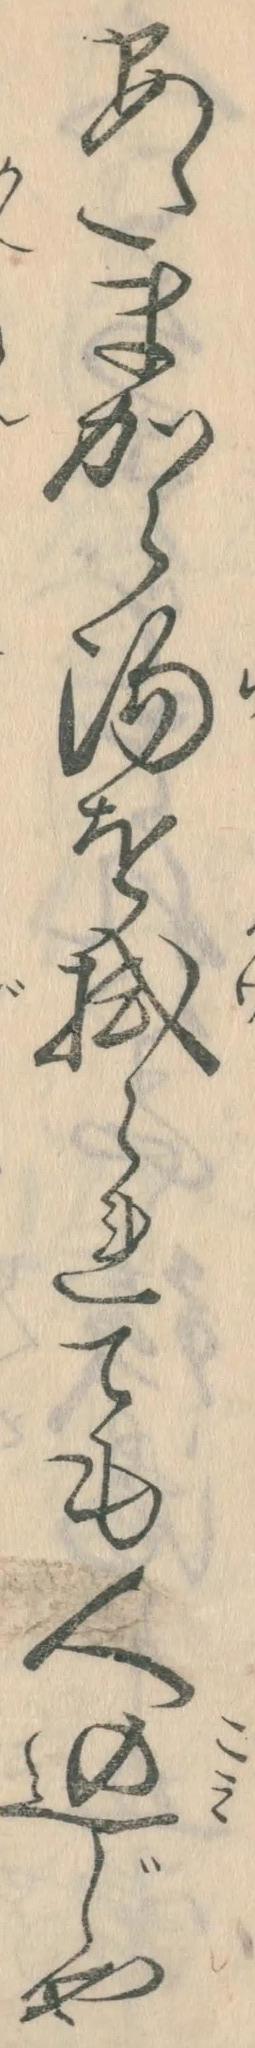あたまから湯を掛られても人込じゃ
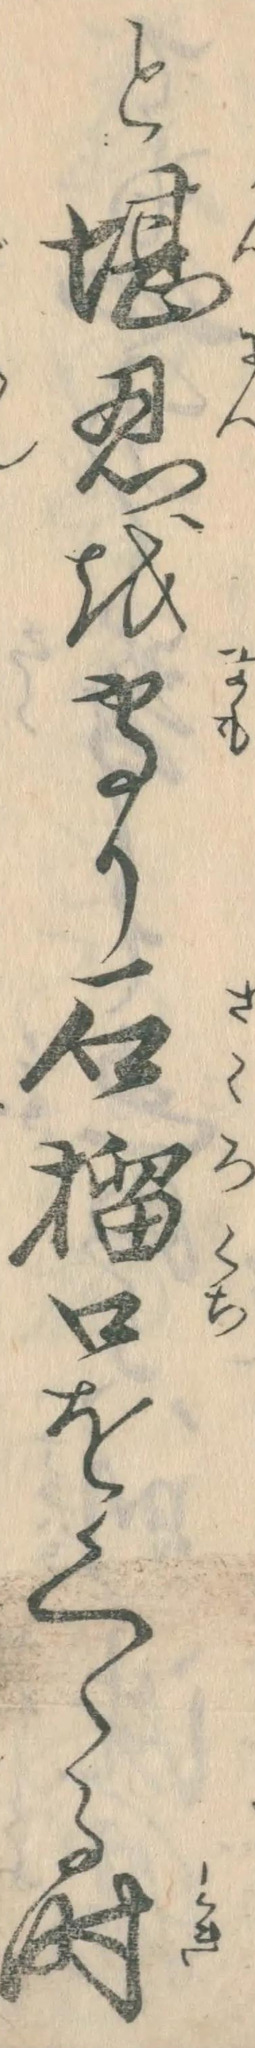と堪忍を守り柘榴口をくゝる時
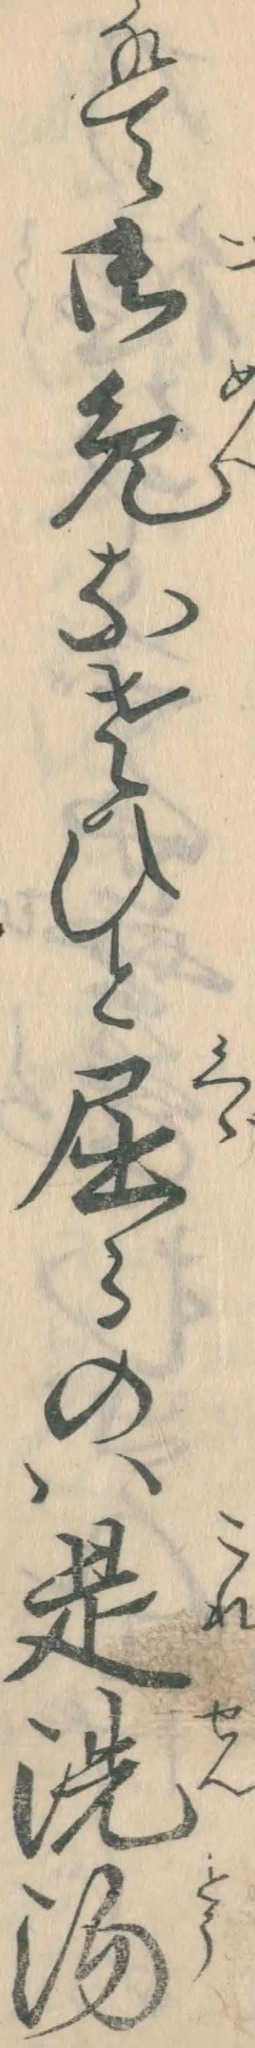は御免なさひと屈るのは是洗湯

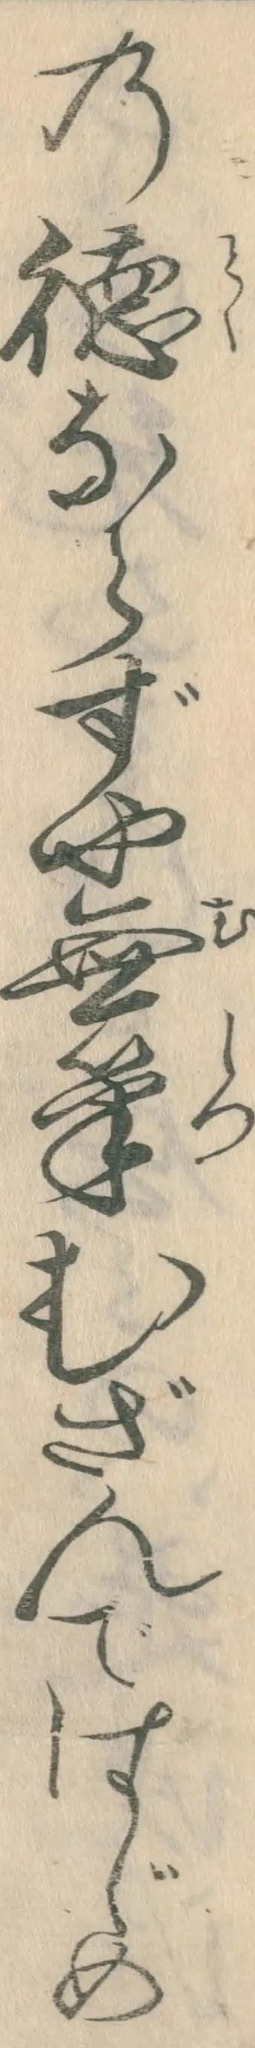の徳ならずや無筆むざんではじめ
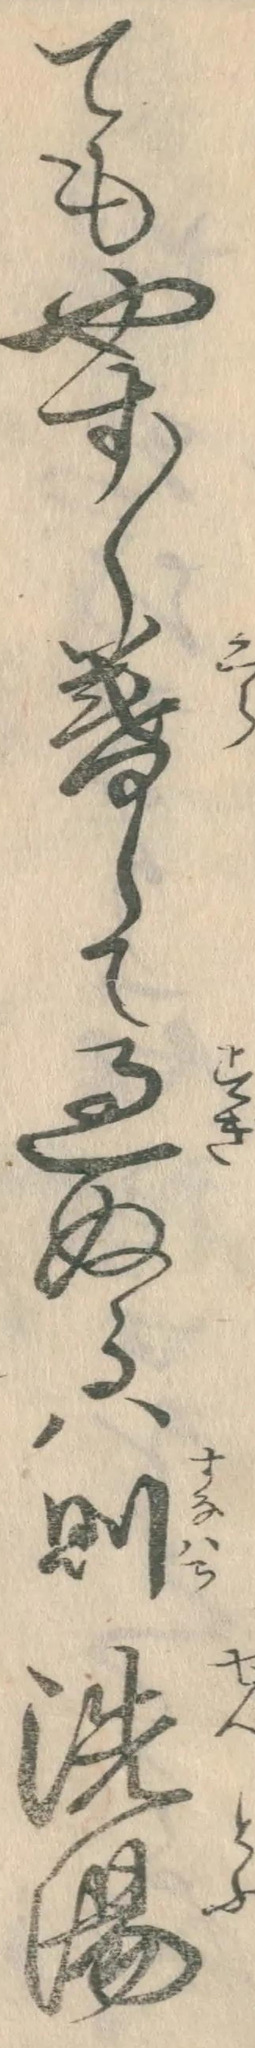てもやす〳〵暮して過ぎぬるは則洗湯
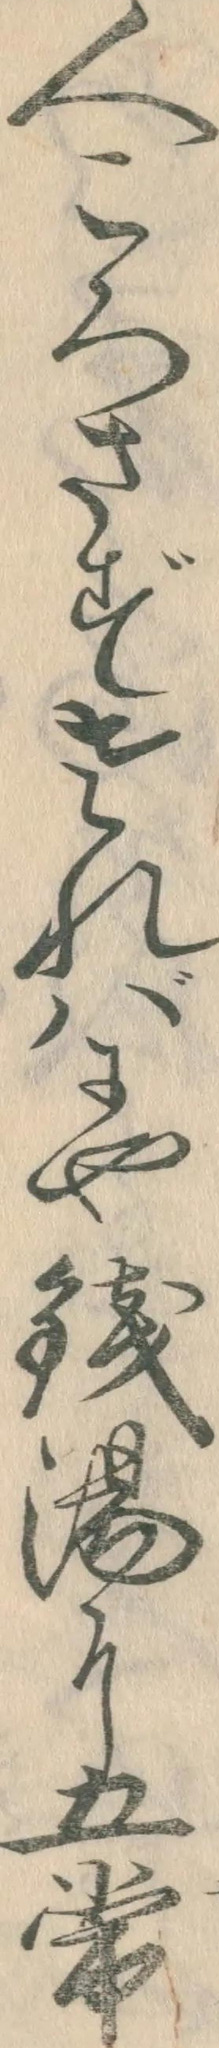人ころさずさればにや銭湯に五常
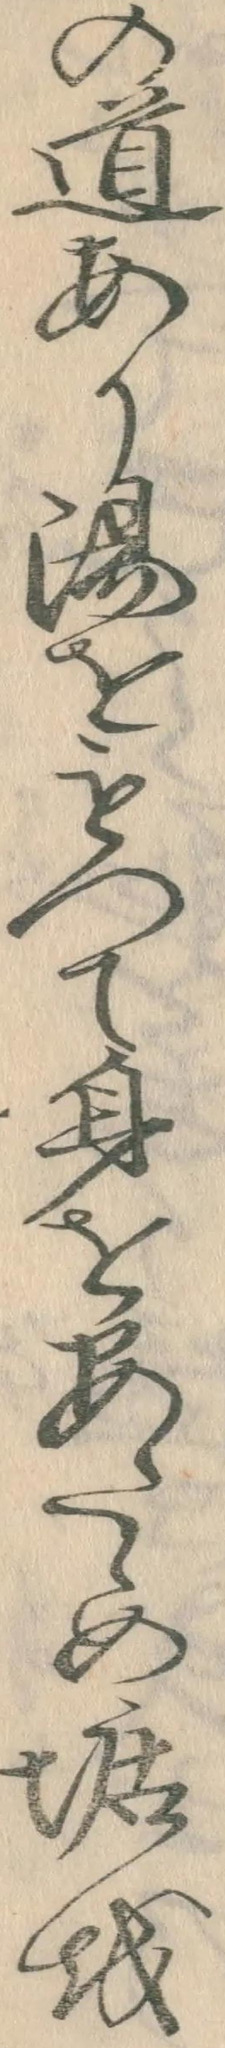の道あり湯をもって身をあたゝめ垢を
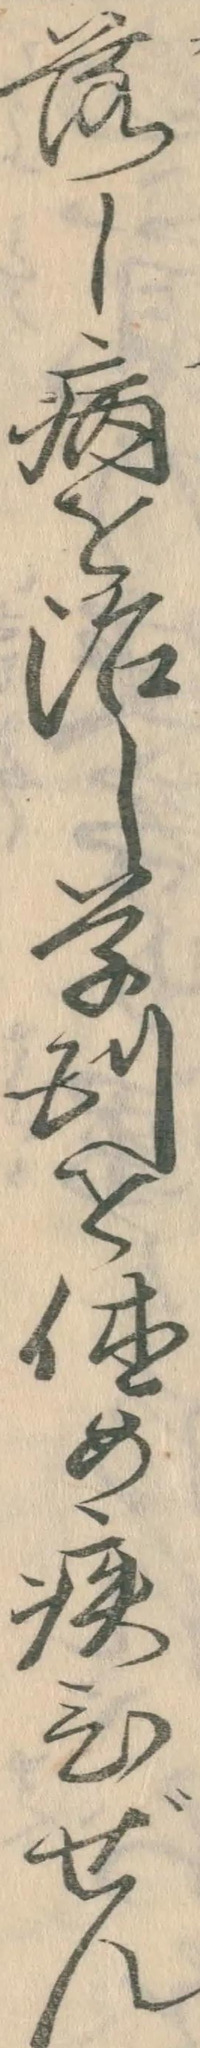落し病を治し草臥を休め疾ひぜん
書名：洗湯手引草
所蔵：国立国会図書館 National Diet Library, JAPAN
